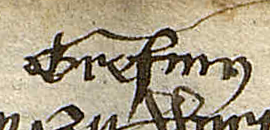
Grefinn*
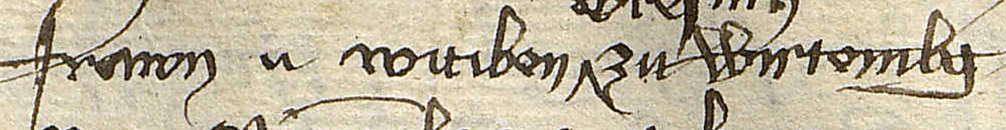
Frawen ~ witiben ʒu Wirtemb*g
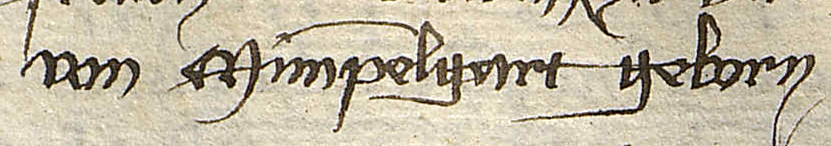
von Mün*pelgart geborn
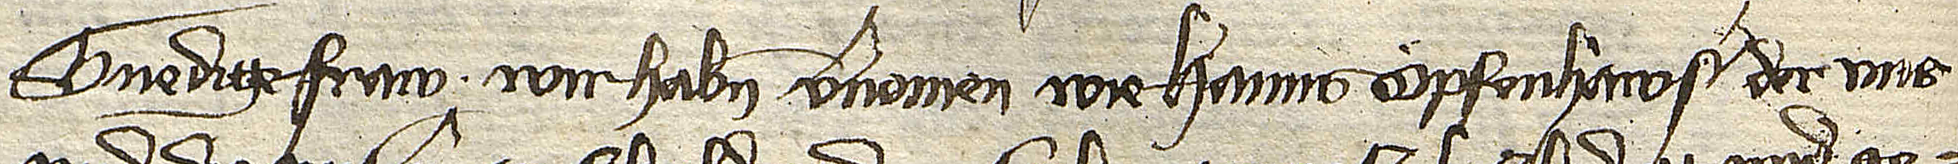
Gnedige fraw . wir habn* v*nomen wie Hanns Öpfenhawſ* der vns
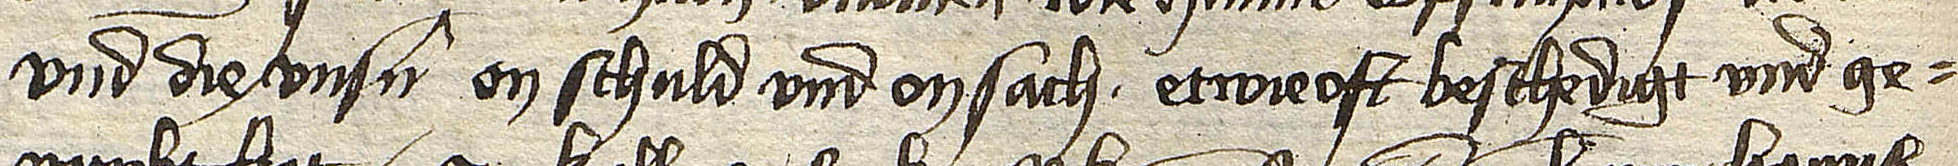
vnd die vnſn* on ſchuld vnd on ſach / etwieoft beſchedigt vnd ge =
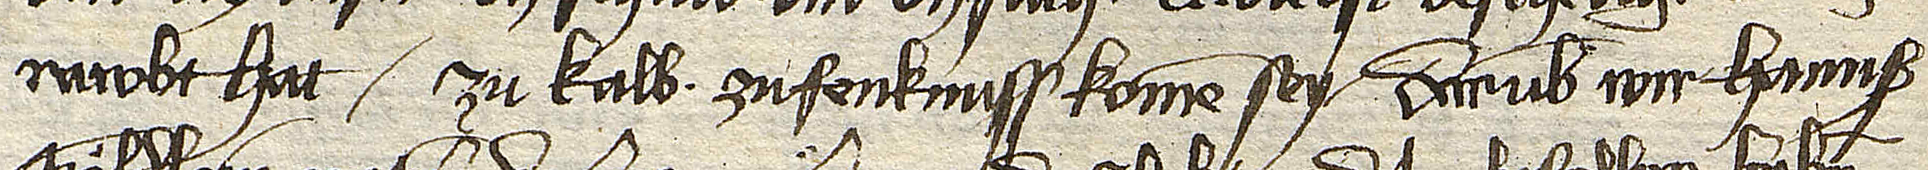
rawbt hat / ʒu kalb . ʒufenknuſſ kome* ſey / Darub* wir hannſ*
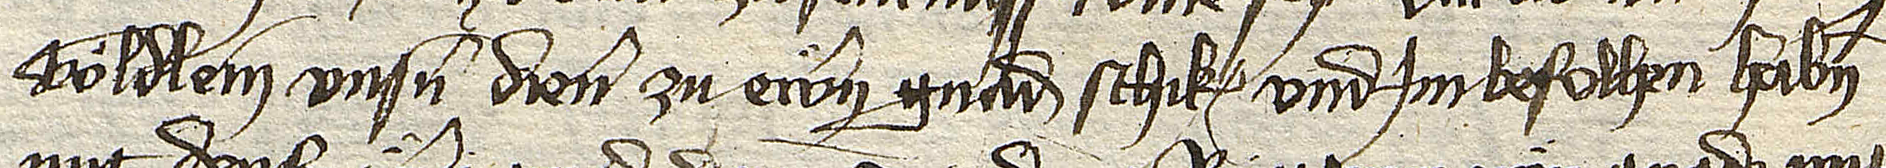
Göldlein vnſn* dien* ʒu eẅ*n gnad* ſchik* vnd Im befolhen habn*
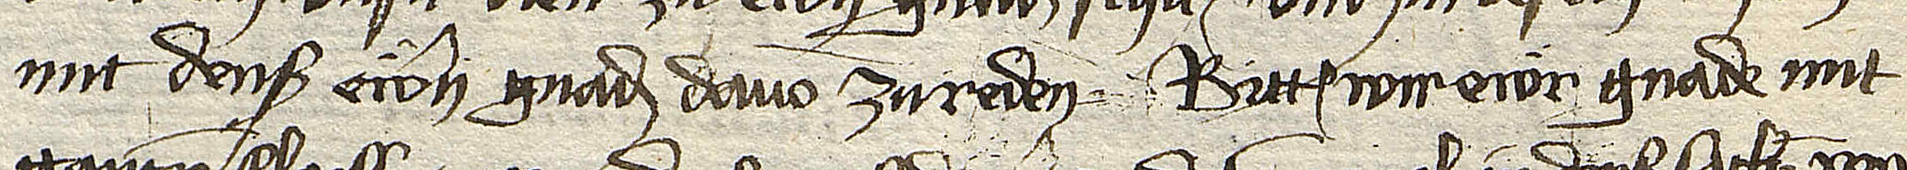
mit denſ* eẅ*n gnad* dauo* ʒureden Bitt* wir eẅr gnade mit
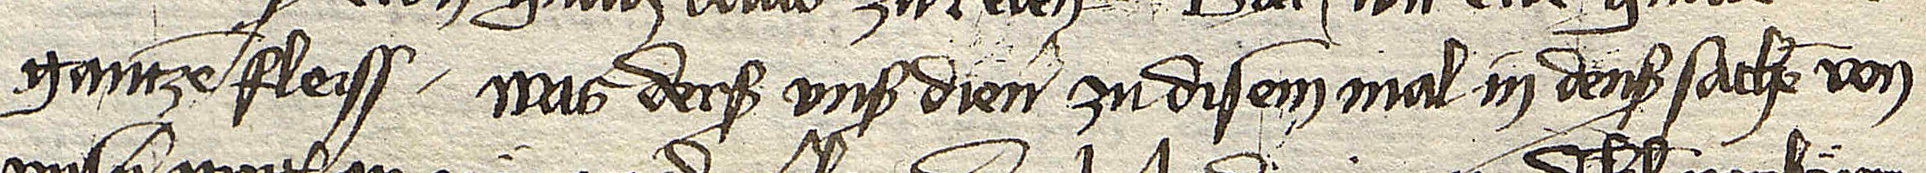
ganʒe* fleiſſ / was derſ* vnſ* dien* ʒu diſem mal . in denſ* ſache* von
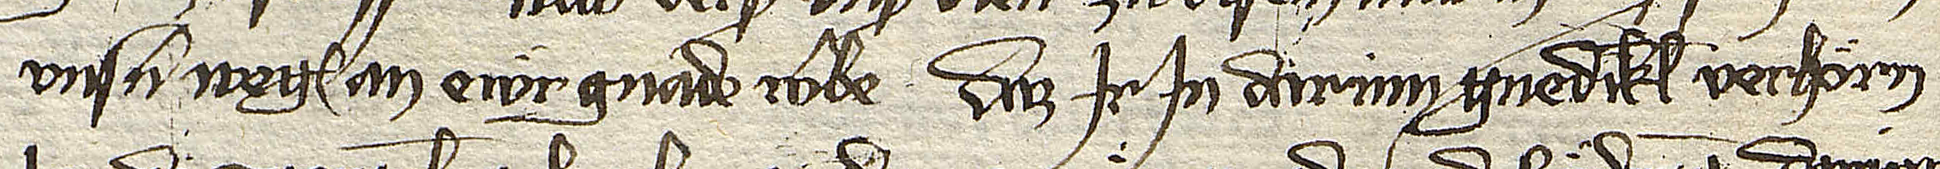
vnſn* weg* an eẅr gnade w*be Daʒ Ir In darinn gnedikl* verhörn
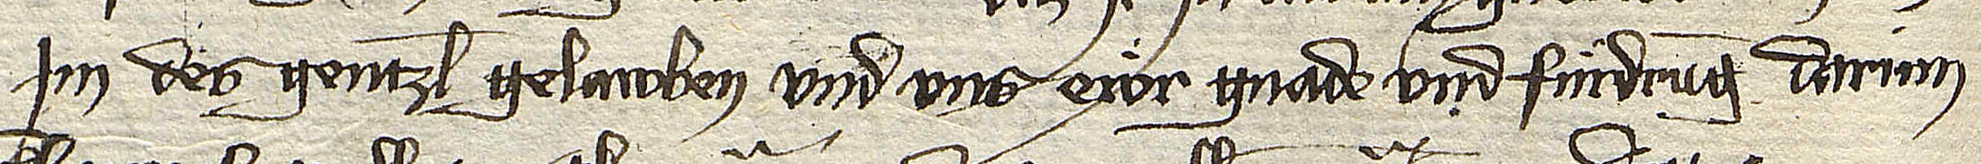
Im des gencʒl* gelawben vnd vns eẅr gnade vnd fürdru*g darinn
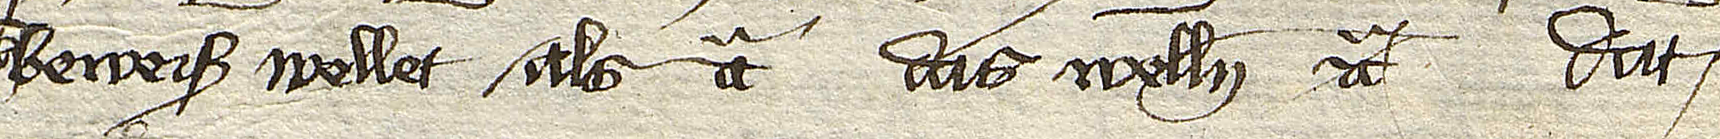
beweiſ* wellet / als ec* das welln* ec* Dat*
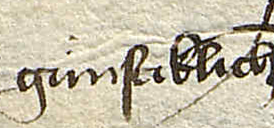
günſtiklich*
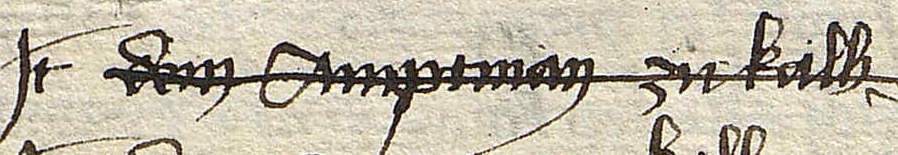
It* dem Amptman ʒu kalb
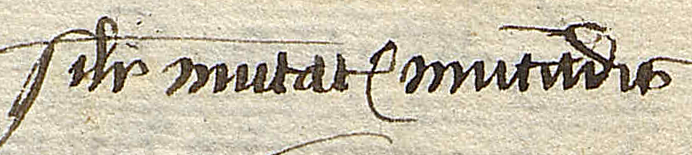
ſilr* mutat* muta*dis
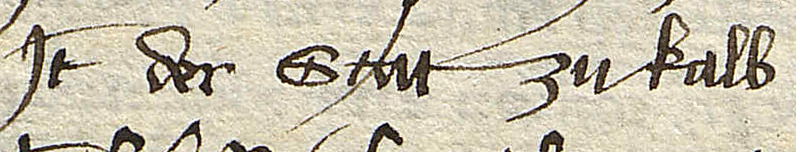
It* der Stat ʒu kalb
